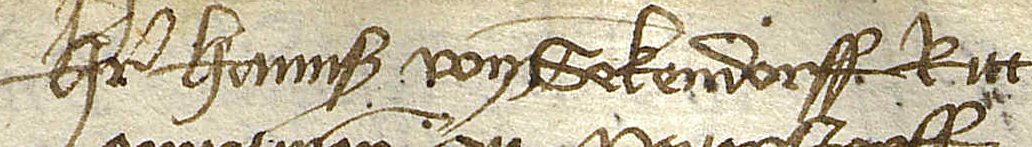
H*r Hannſ* von Sekendorff Ritt*
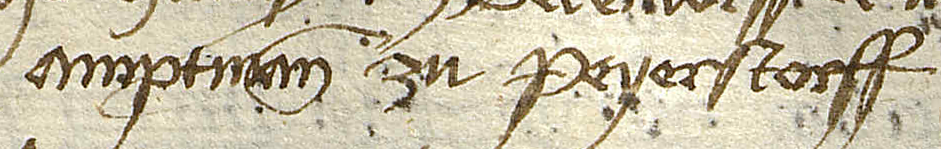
amptman* ʒu Peyerſtorff
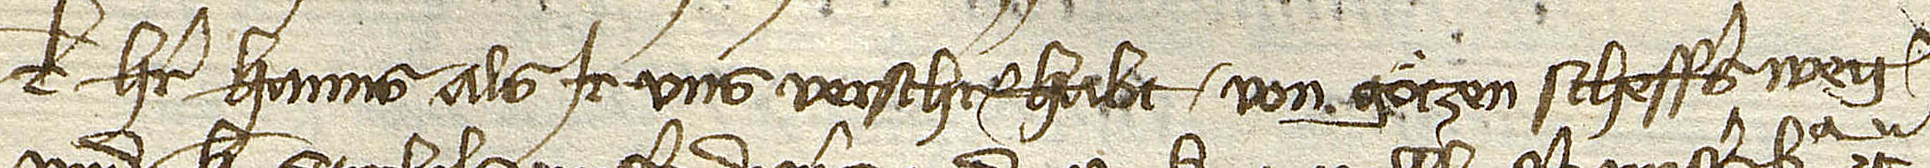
L* h*r hanns als Ir vns verſchr* habt / von göcʒen ſcheff*s weg*
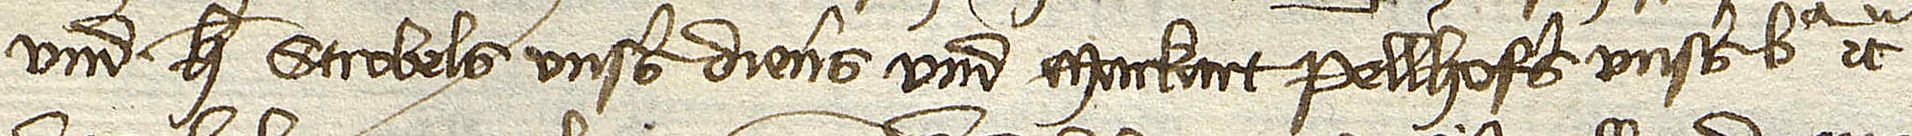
vnd H* Strobels vnſ*s dien*s vnd Markaret Pellhof*s vnſ*s b* ec*
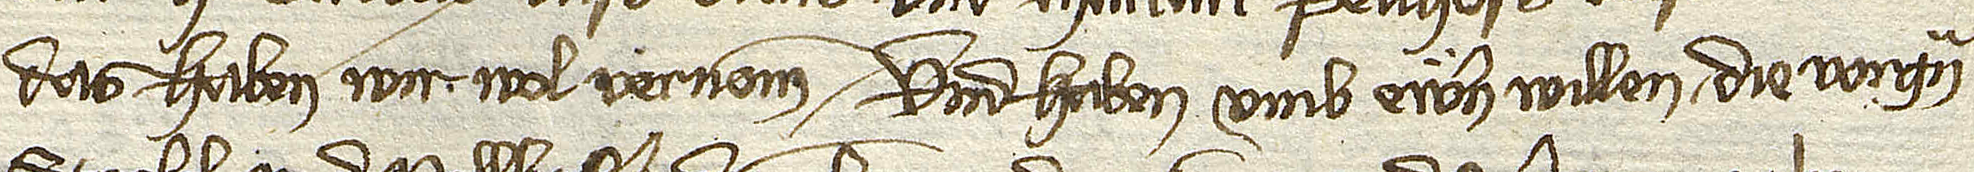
das haben wir wol vernom* / Vnd haben vmb ew*n willen / die vorg*n
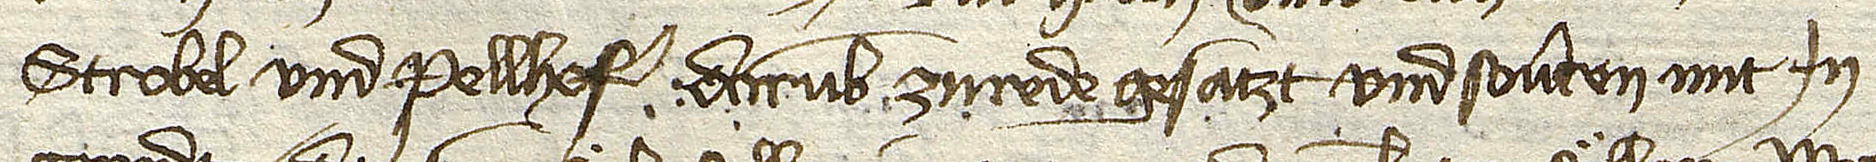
Strobel vnd Pellhof* daru*b ʒurede geſacʒt vnd ſou*ren mit In
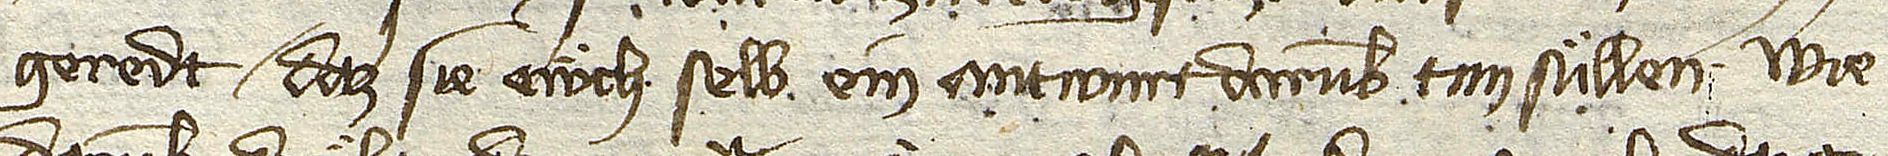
geredt / daʒ ſie ewch ſelb ein antwurt daru*b tun ſüllen . Wie
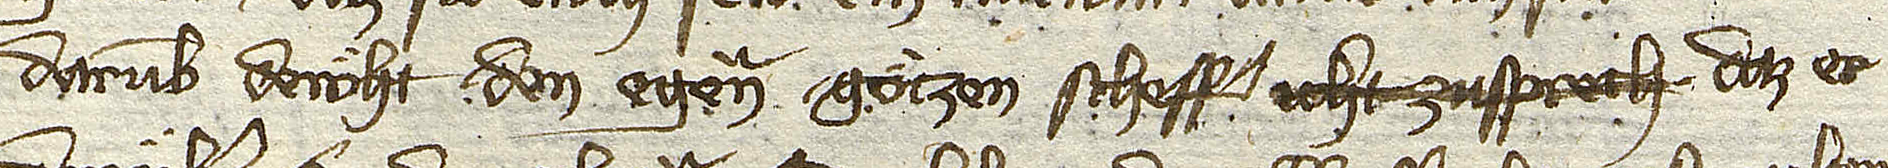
daru*b dewcht / den ege*n / göcʒen ſcheff* icht ʒuſprech daʒ er
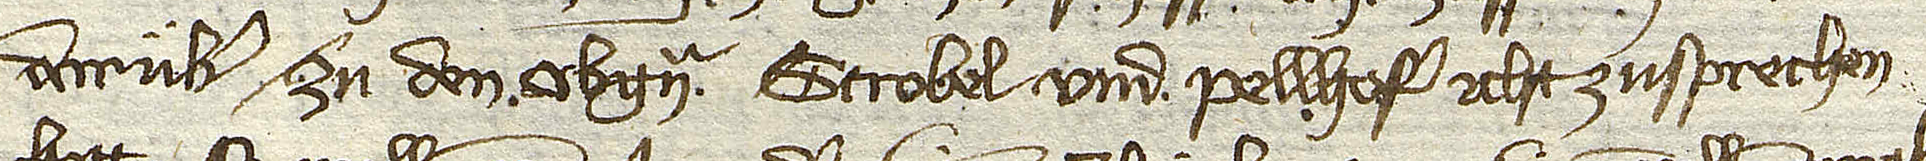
darüb* / ʒu den obg*n Strobel vnd pellhof* icht ʒuſprechen
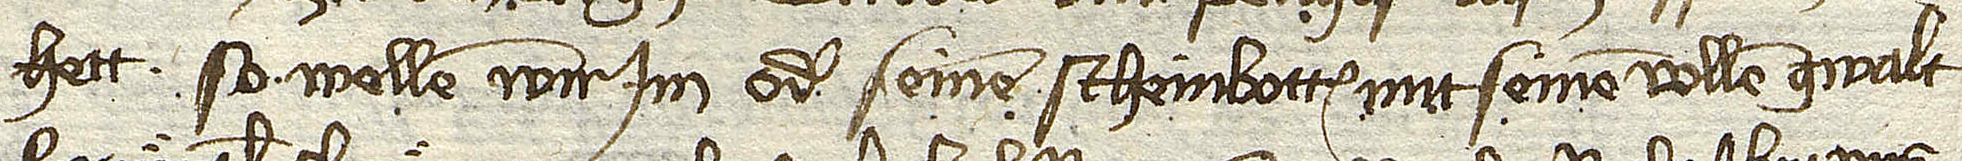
hett . ſo welle* wir Im od* ſeine* ſcheinbott* mit ſeine volle* gwalt
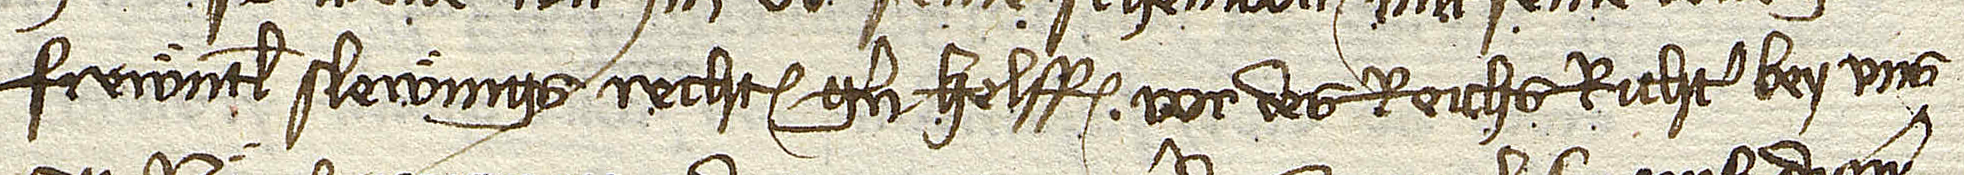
frewntl* ſlewnigs recht g*n helff* vor des Reichs Richt* bey vns
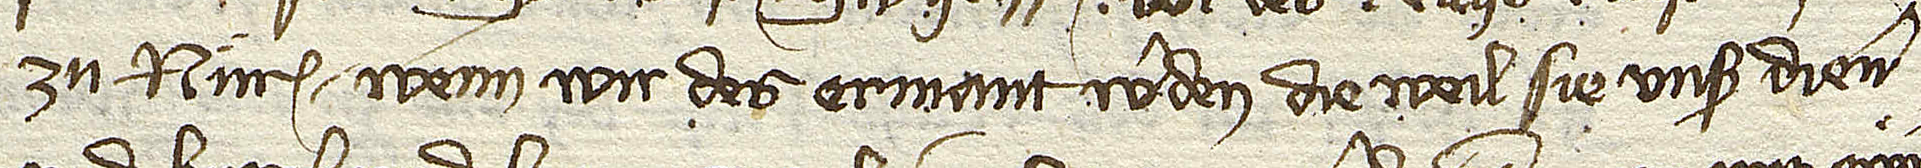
ʒu Nür* / wenn wir des ermant w*den die weil ſie vnſ* dien*
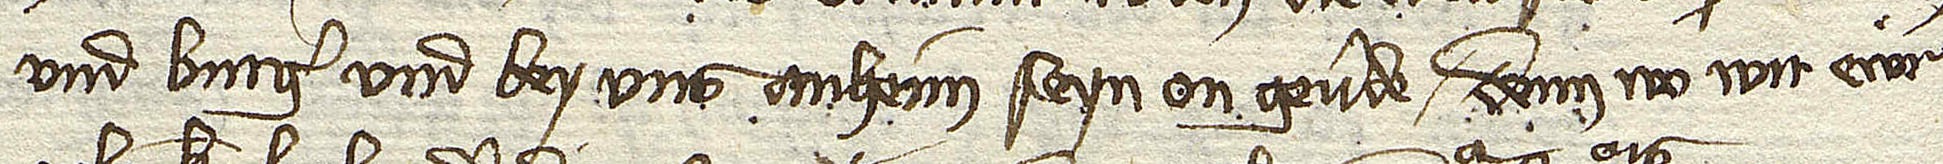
vnd burg* vnd bey vns anheim ſeyn on geu*de / Denn wo wir ew*r
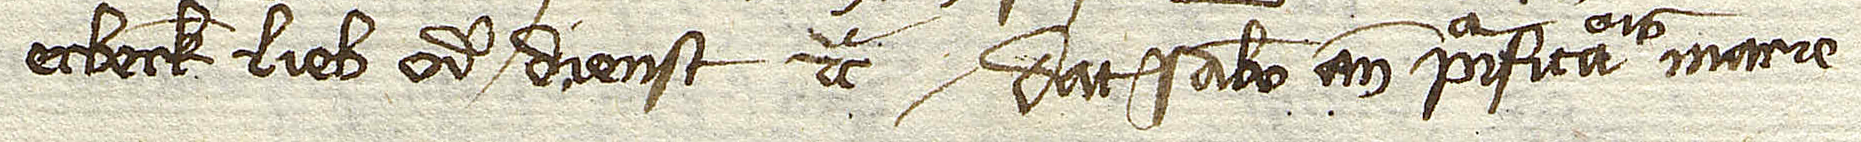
erberk* lieb od* dienſt ec* / Dat* ſabo* an* p*ifica* marie
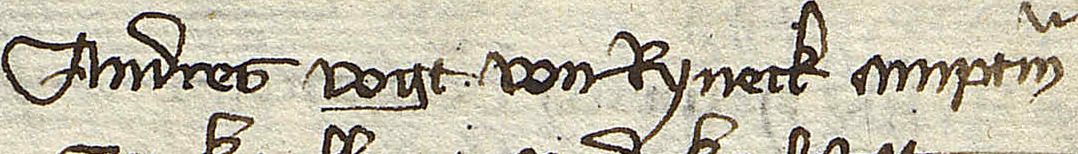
Andres vot von Ryneck amptm*
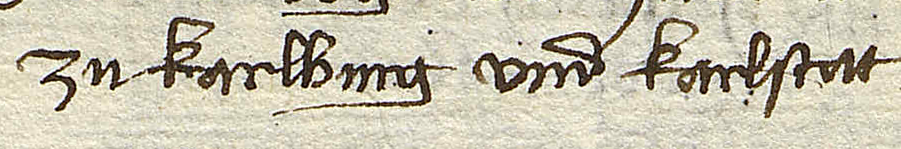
ʒu karlburg vnd karlſtat
